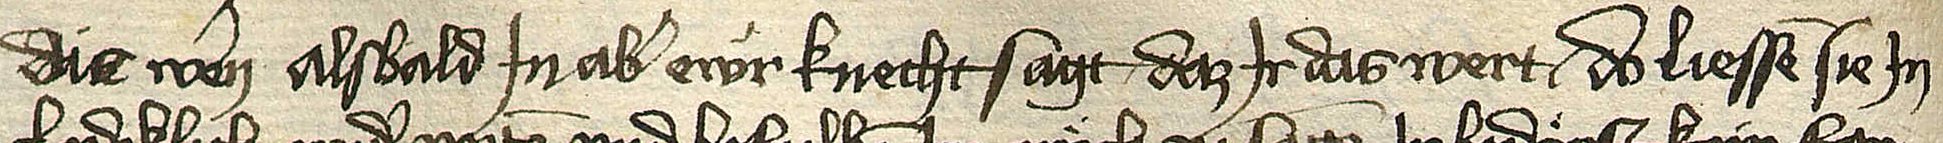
die w*en alſbald In ab* eẅr knecht ſagt / daʒ Ir das wert / Do lieſſe* ſie In
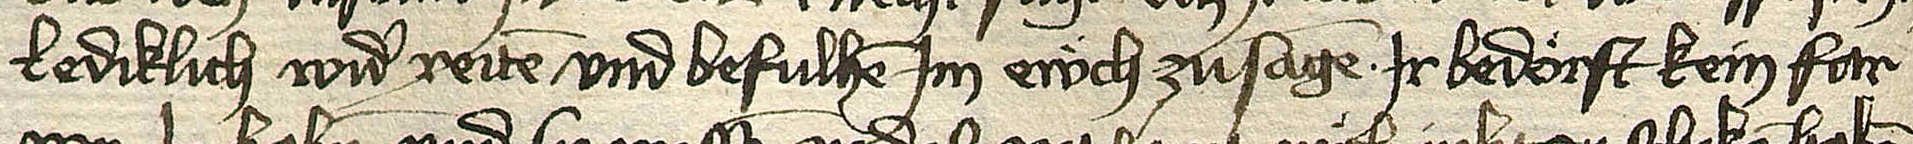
lediklich wid* reite* vnd befulhe* Im eẅch ʒu ſage* . Ir bedörft kein far
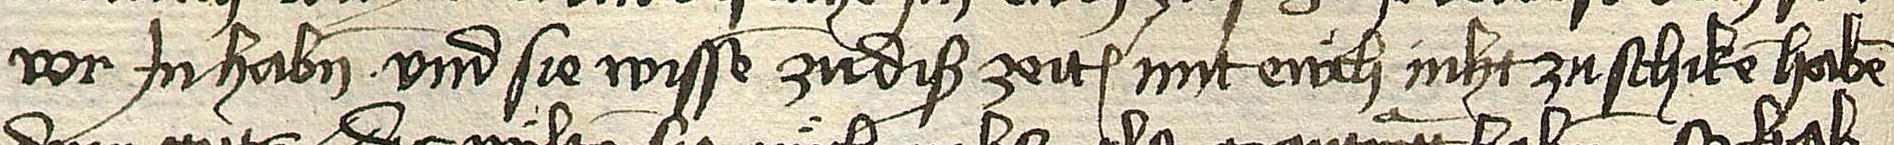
vor In habn* . vnd ſie wiſſe* ʒu diſ* ʒeit* mit eẅch niht ʒu ſchike* habe*
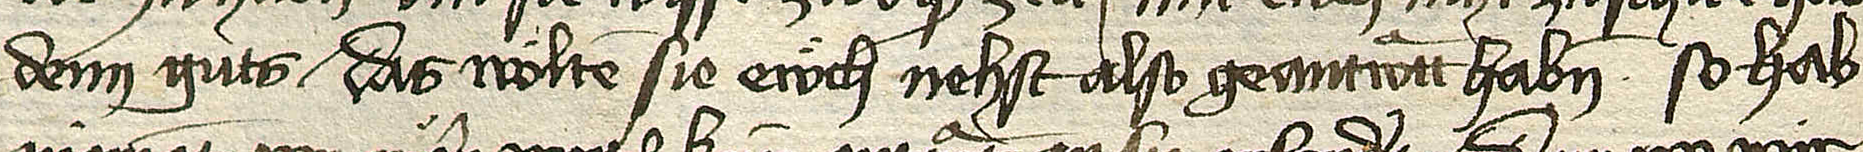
denn guts / Das wölte* ſie eẅch nehſt alſo geantw*tt habn* . ſo hab
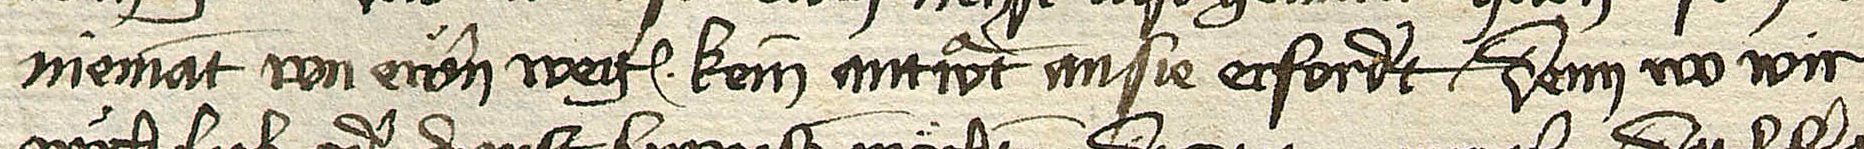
niema*t von eẅ*n weg* . kein antw*t an ſie erford*t / Denn wo wir
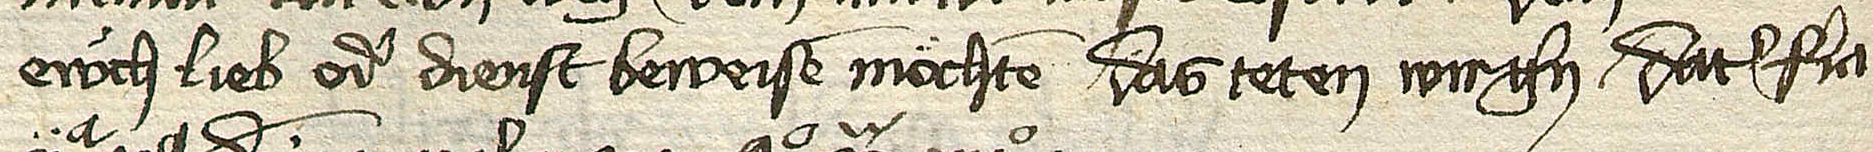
eẅch lieb od* dienſt beweiſe* möchte* / Das teten wir g*n / Dat* fi*a
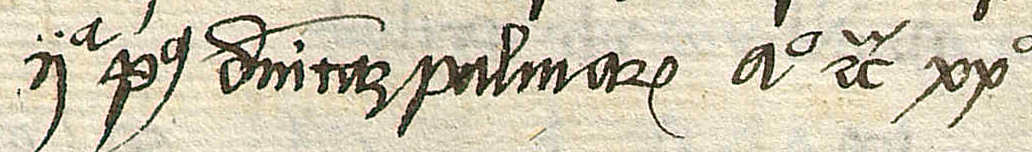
ii* p* dni*ca* Palma* a* ec* xx*
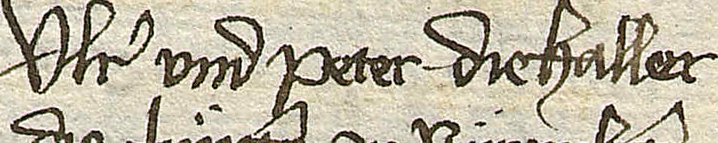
Vlr* vnd peter die Haller
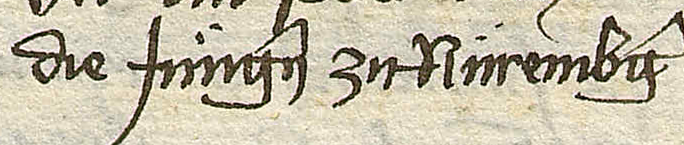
die Iüng*n ʒu Nüremb*g
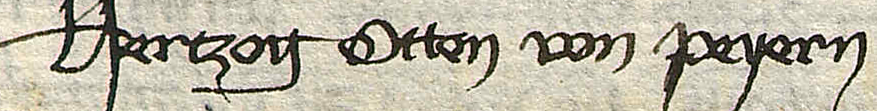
Hercʒog Otten von Peyern
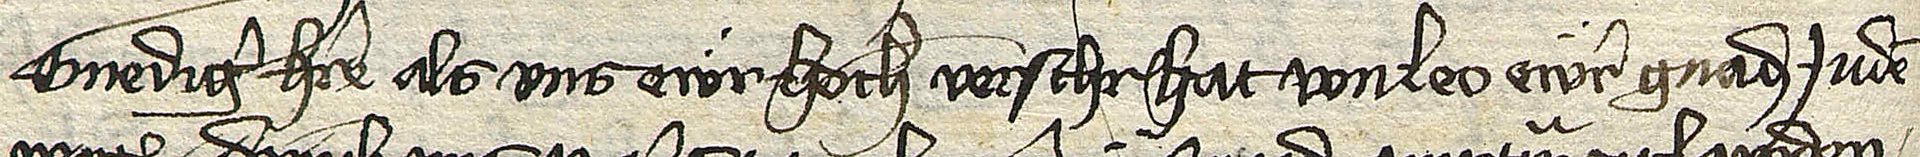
Gnedig* h*re als vns eẅr hoch* verſchr* hat von leo eẅr* gnad* Iude*
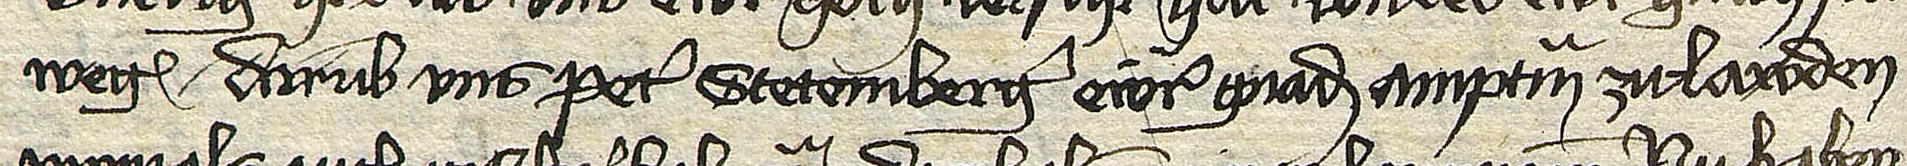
weg* / Darub vns Pet* Stetemberg* eẅr* gnad* amptm* ʒu lawden
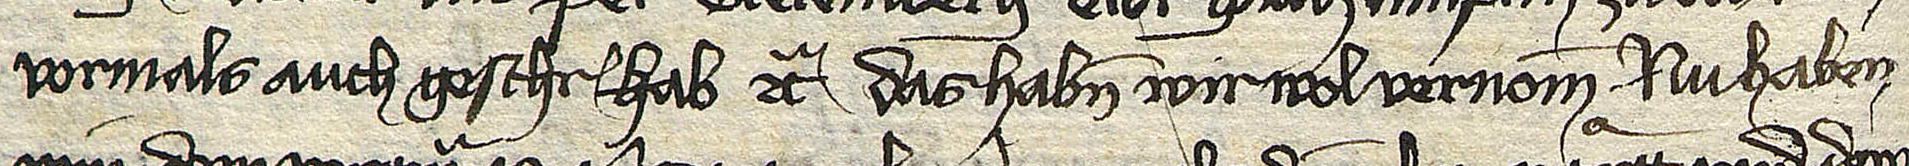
vormals auch geſchr* hab ec* Das habn* wir wol vernom* Nu haben
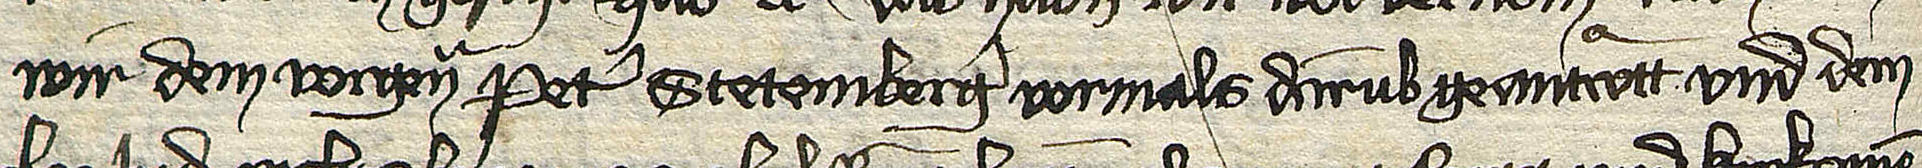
wir dem vorgen* Pet* Stetemberg* vormals darub* geantw*tt vnd dem
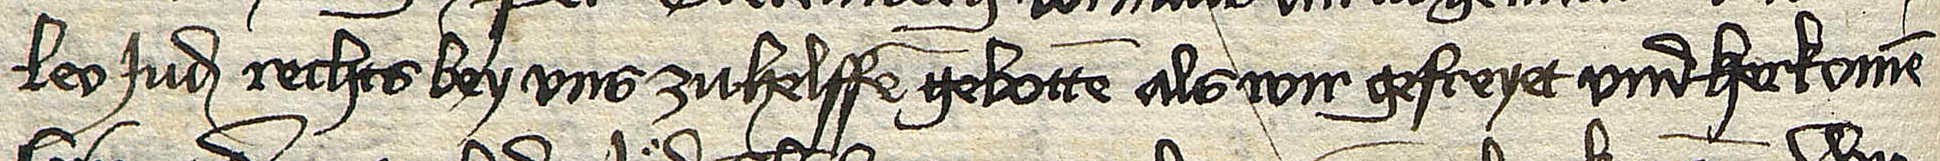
leo Iud rechts bey vns ʒu helffe* gebotte* als wir gefreyet vnd herkome*
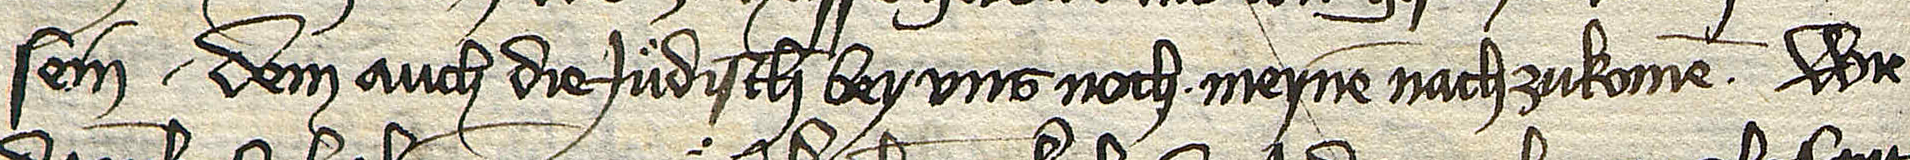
ſein / Dem auch die Iüdiſch* bey vns noch meyne* nach ʒukome* . Wie
